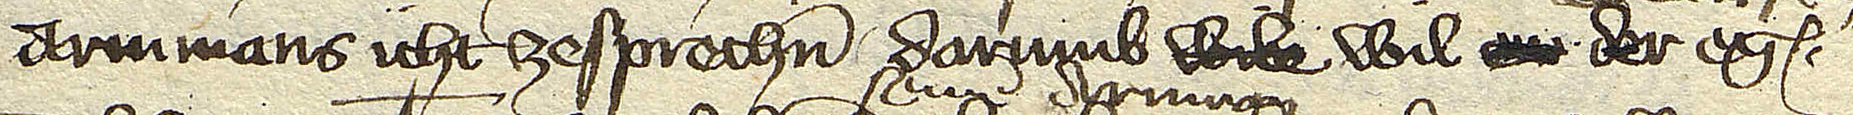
Armmans icht cʒeſprechn* / darumb wile wil ew der eg* /
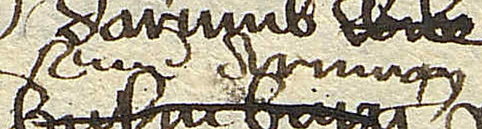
ſeine* Armman
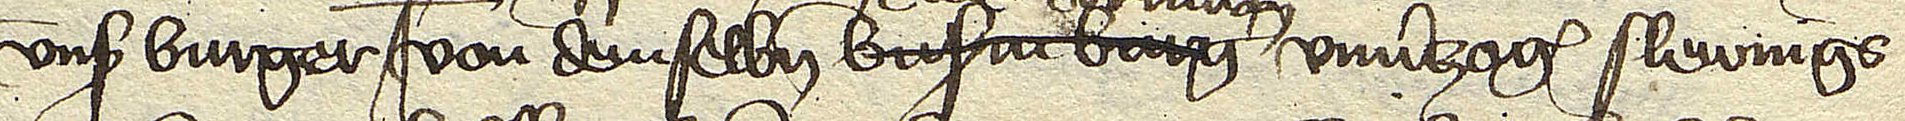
vnſ* burger von demſelbn* vnſ*m burg* vnu*cʒog* ſlewnigs
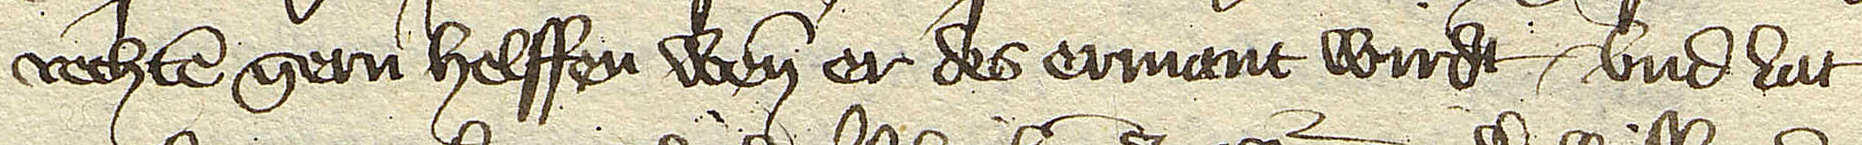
rechte* gern helffen wen* er des ermant wirdt / vnd lat
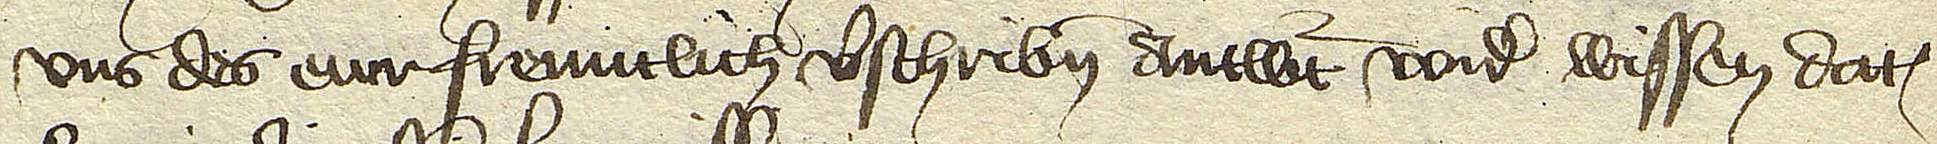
vns des ewr freuntlich v*ſchribn* Antwt* wid* wiſſen dat*
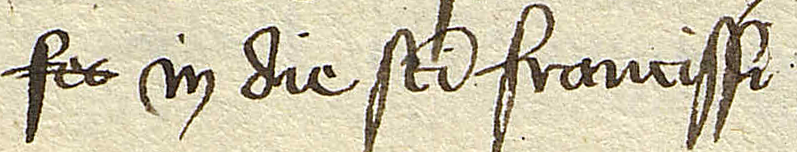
fe in die ſci* franciſſi
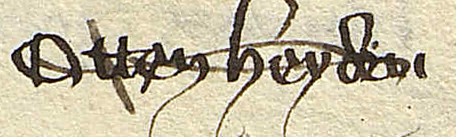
Otten Heyden
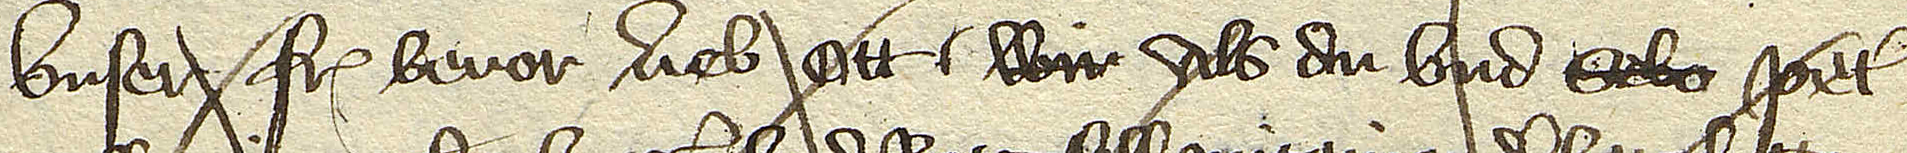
Vnſer fr* beuor Lieb Ott / wir Als du vnd Sebo Pet*
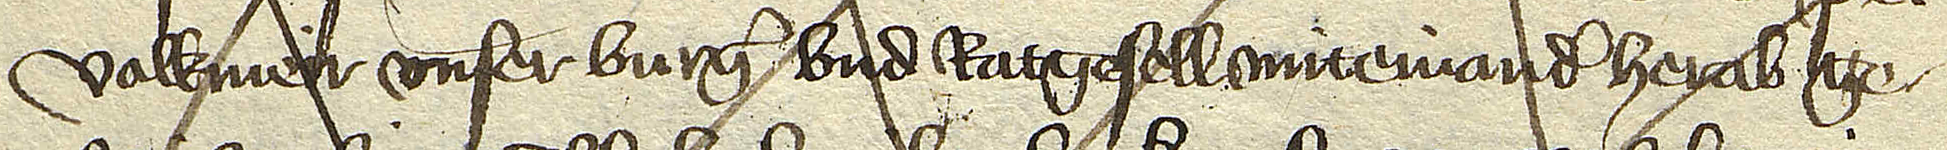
Volkmeir vnſer burg* vnd Ratgeſell miteinand* herab ge -
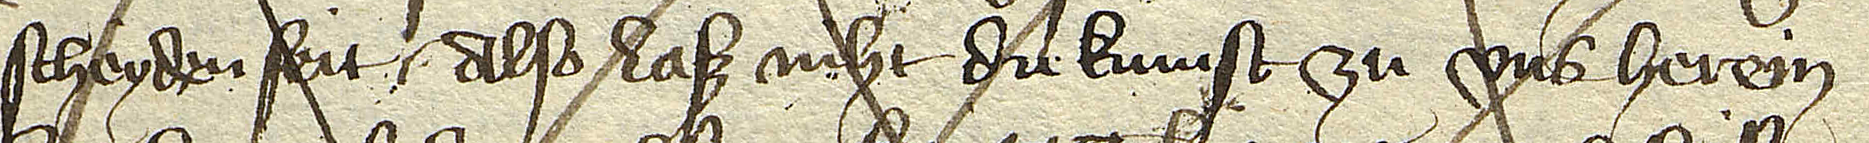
ſcheyden ſeit / Alſo laſʒ niht die kumſt cʒu vns herein
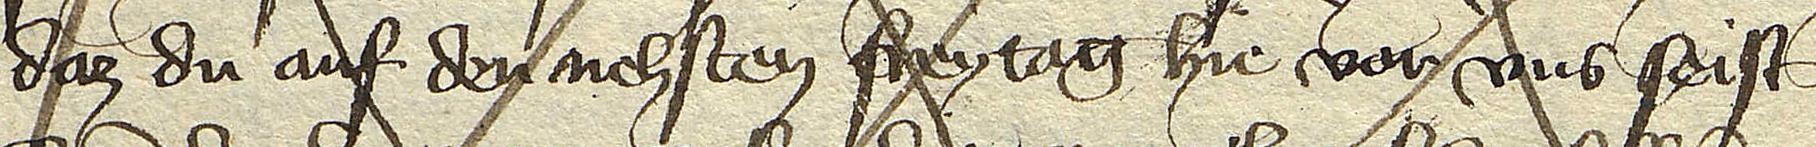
daʒ du auf den nehſten freytag hie von vns ſeiſt
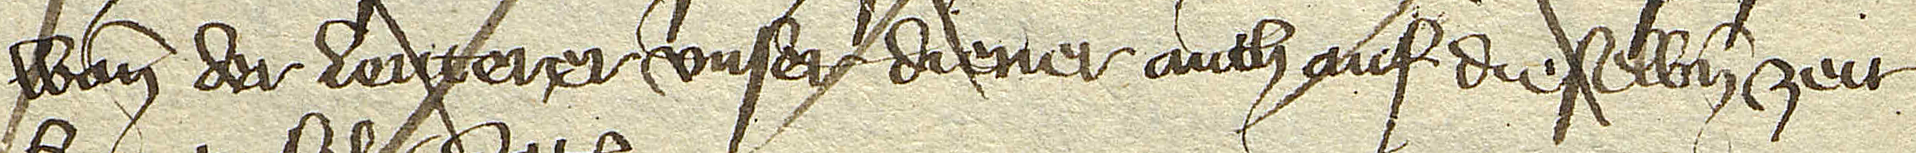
wan* der leuterer vnſer diener auch auf dieſelbn* cʒeit
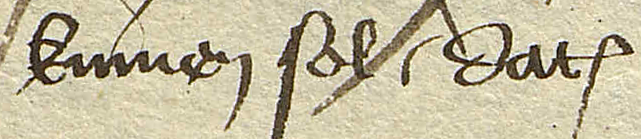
kumen ſol / dat*
